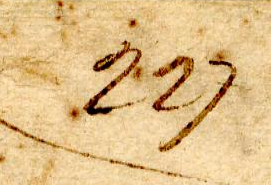227
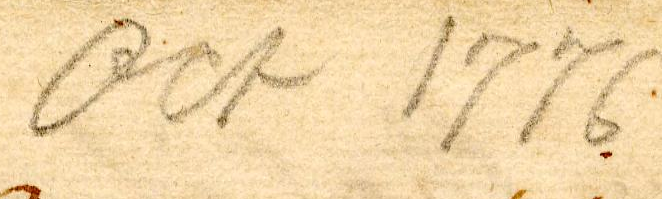Oct 1776
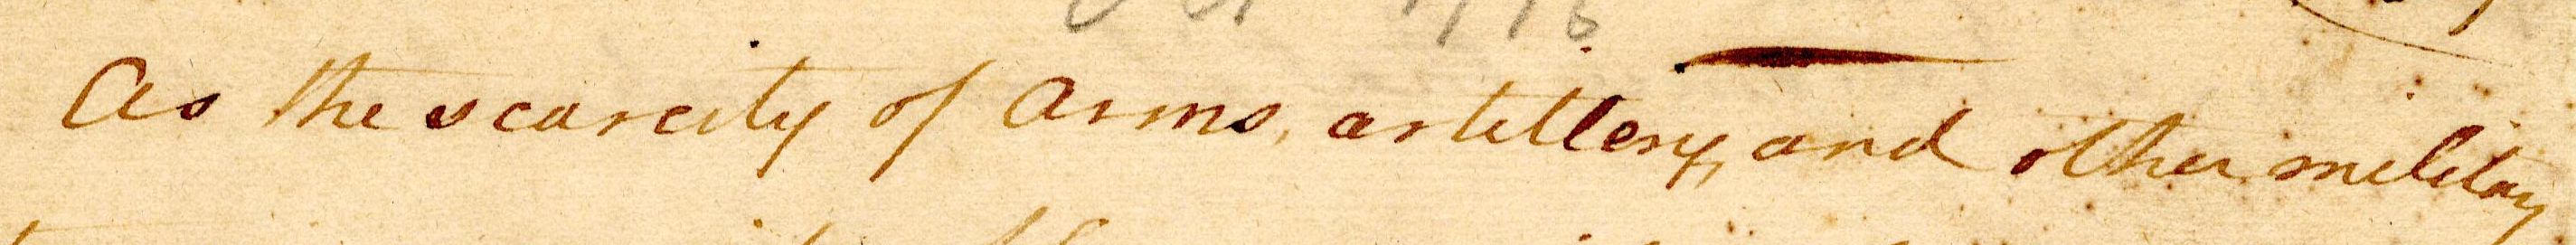As the scarcity of arms artillery and other military
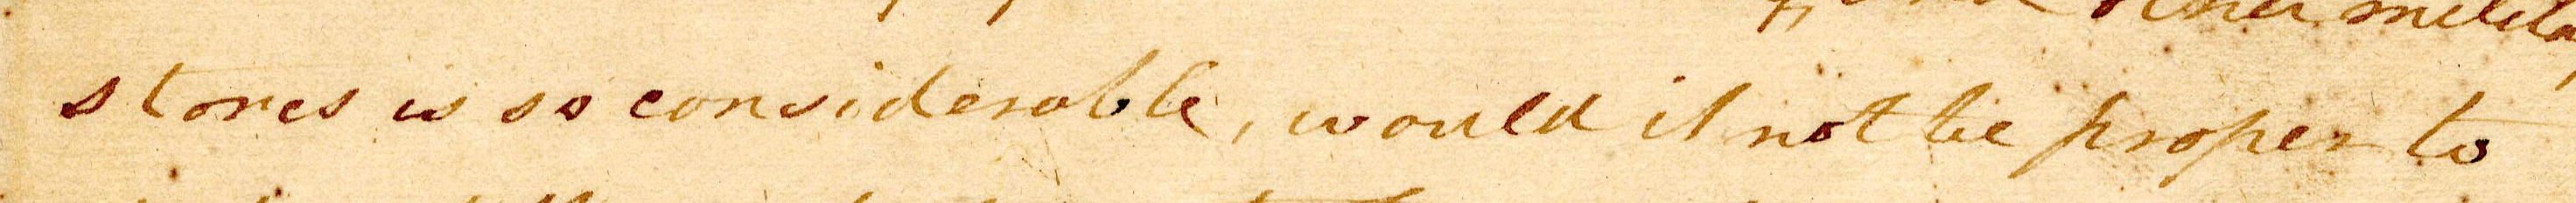stores is so considerable, would it not be proper to
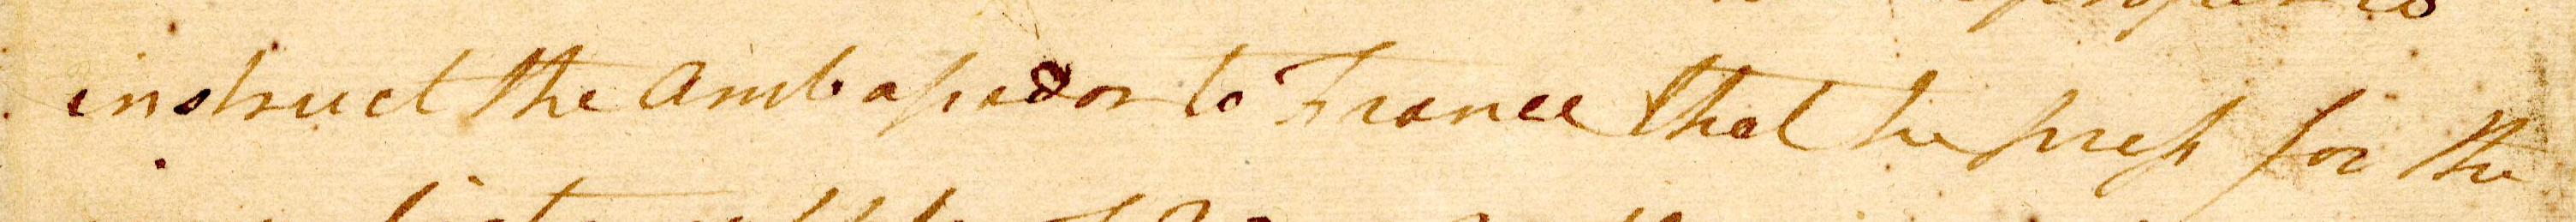instruct the Ambassador to France that he press for the
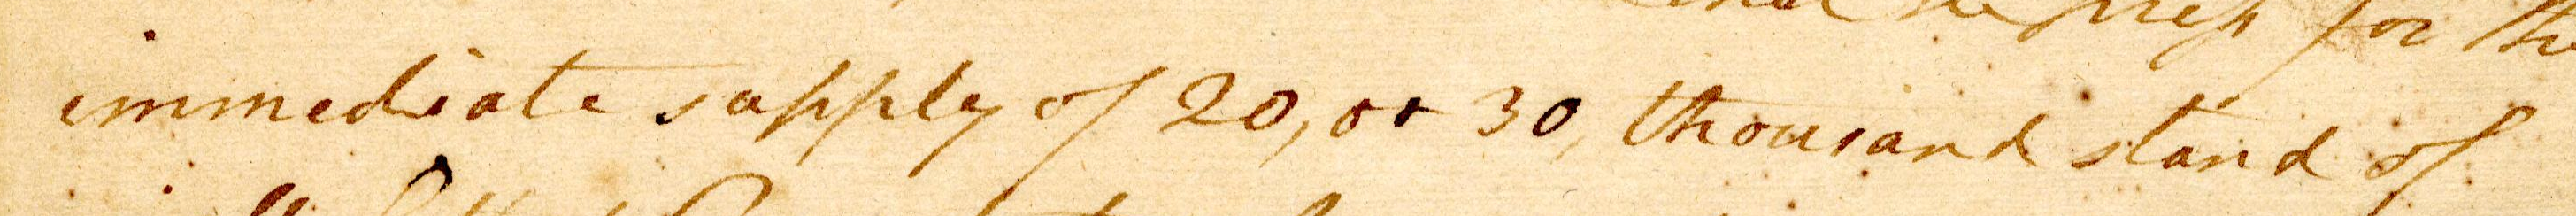immediate supply of 20, or 30, thousand stand of
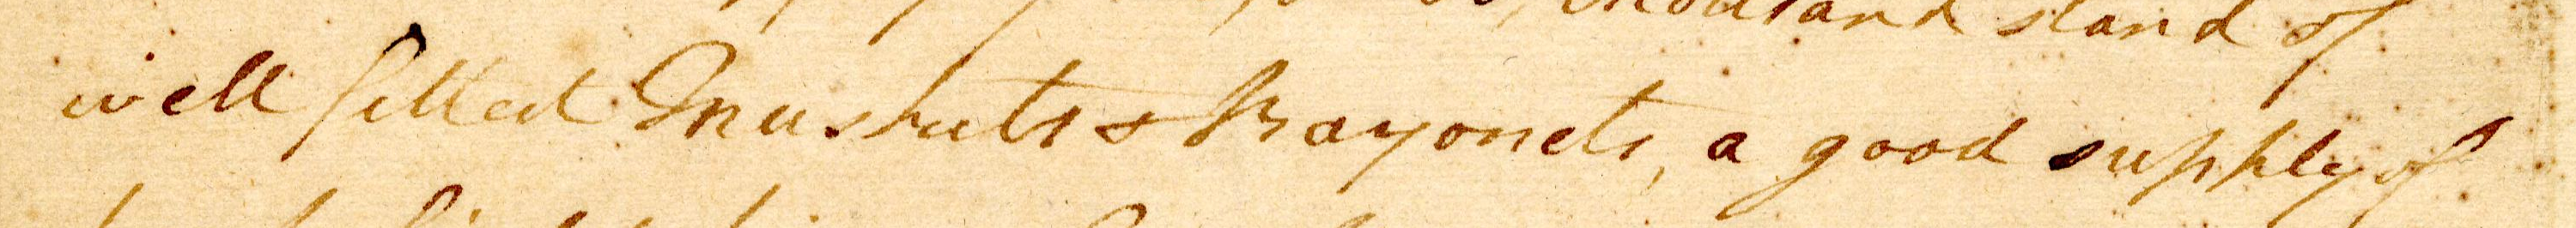well pelled muskets & Bayonets a good supply of
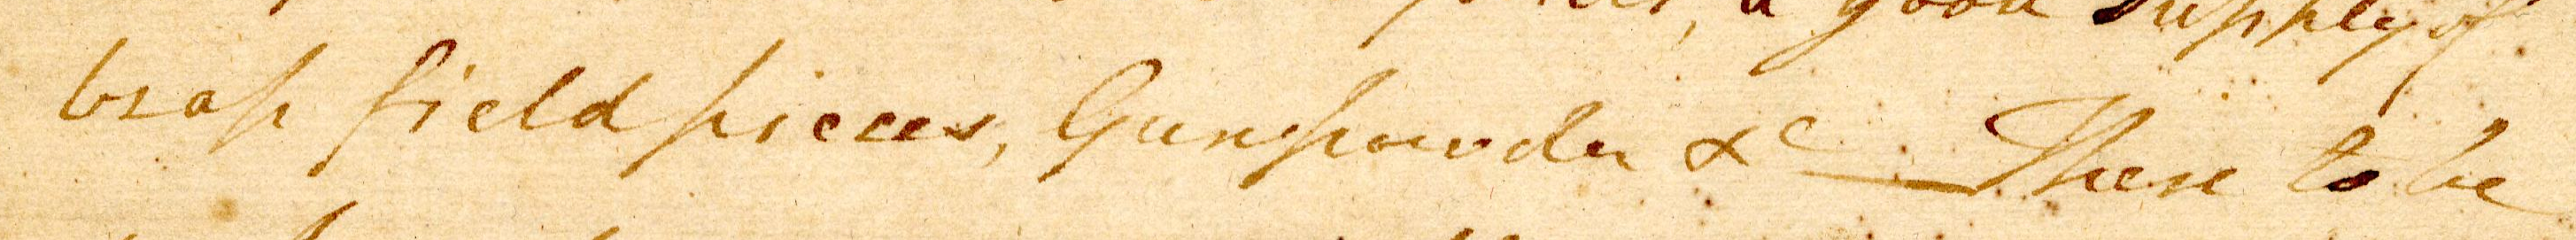grass field pieces, Gunpowder &^c- These to be
